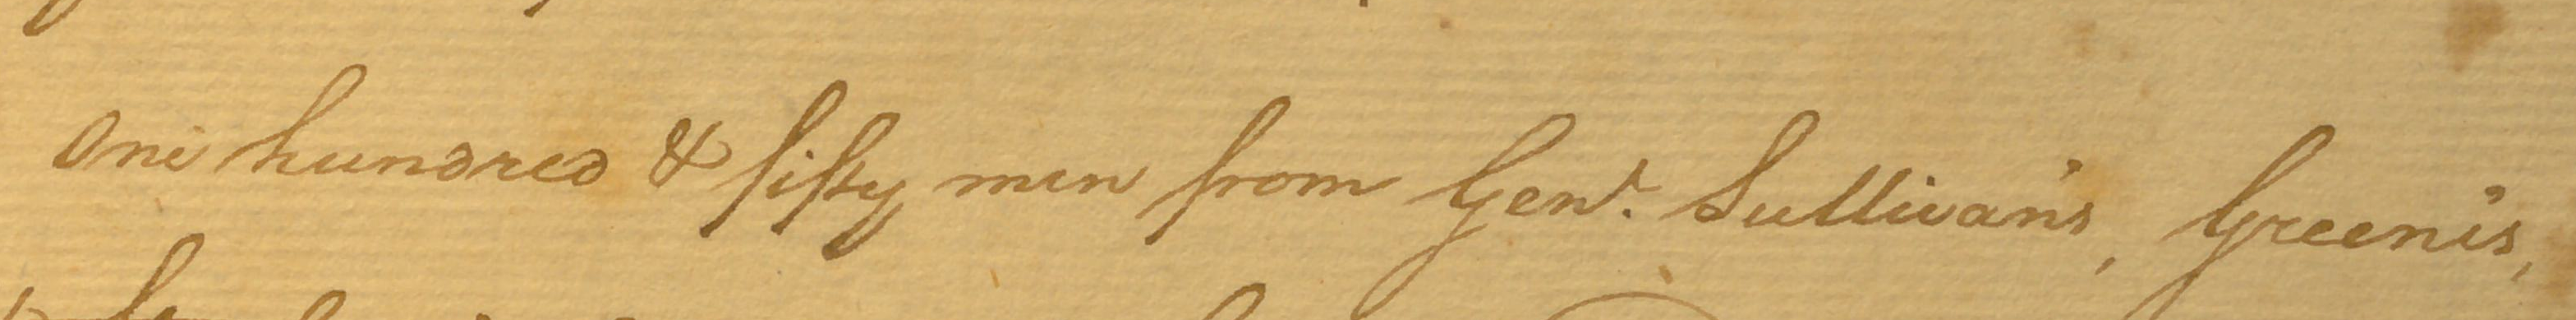One hundred & fifty men from Gen^l. Sullivan's, Greene's,
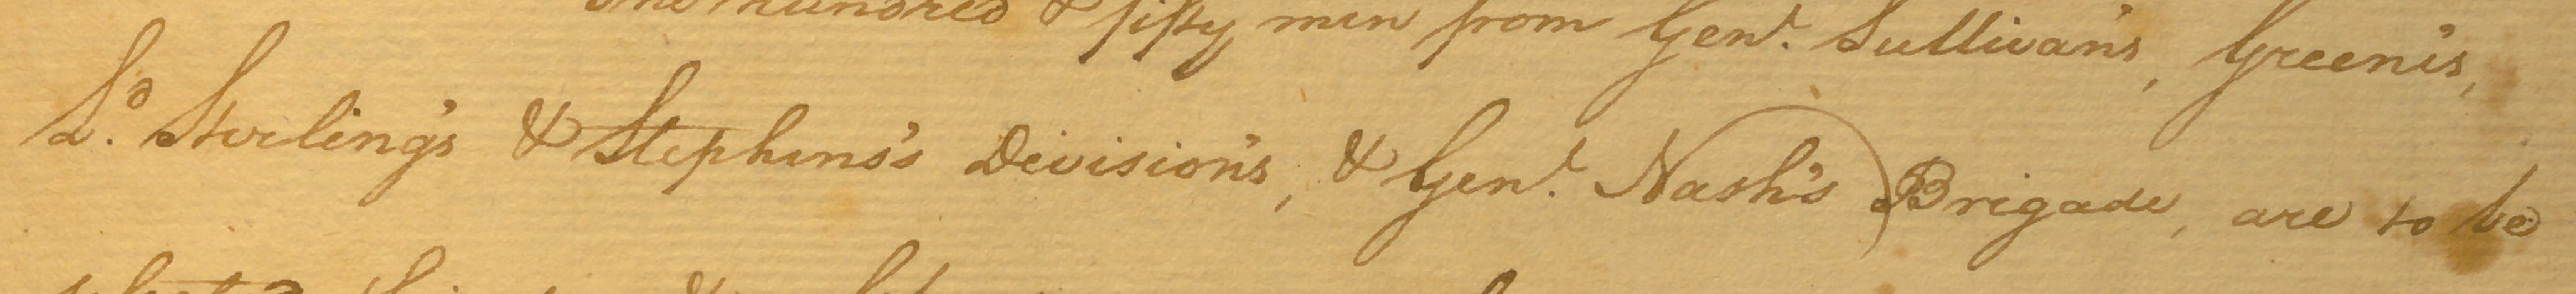L^o. Stirling's & Stephans's Divisions, & Gen^l. Nash's Brigade, are to be
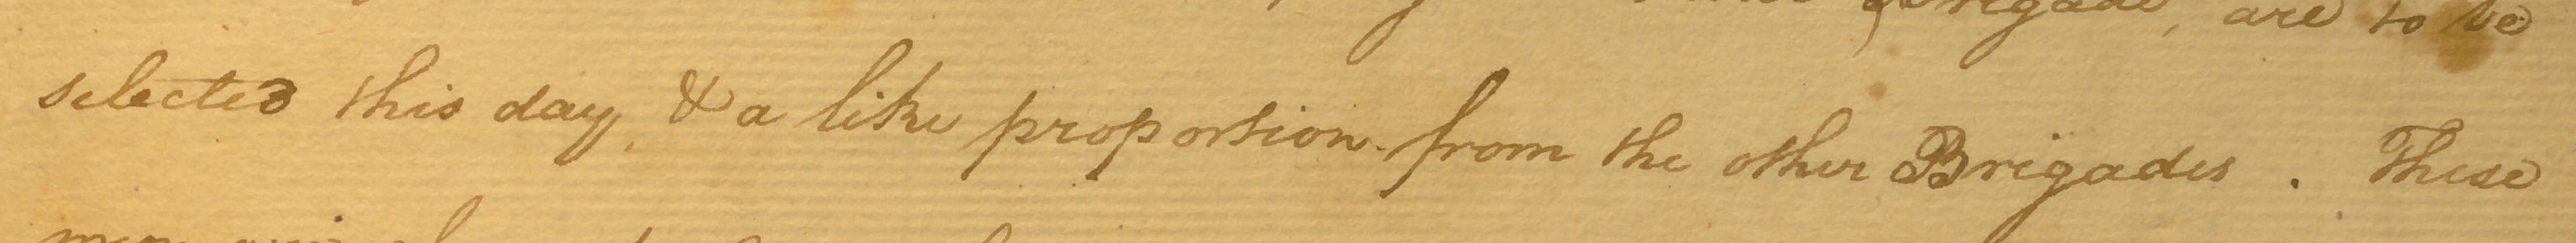selected this day & a like proportion from the other Brigades. These
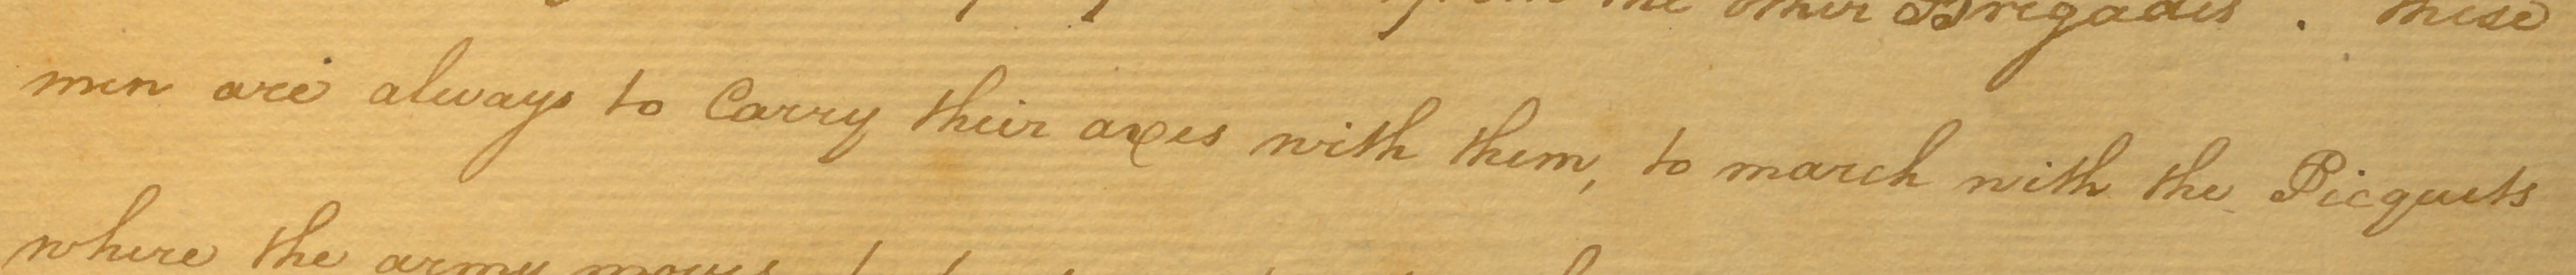men are always to Carry their axes with them, to march with the Picquets
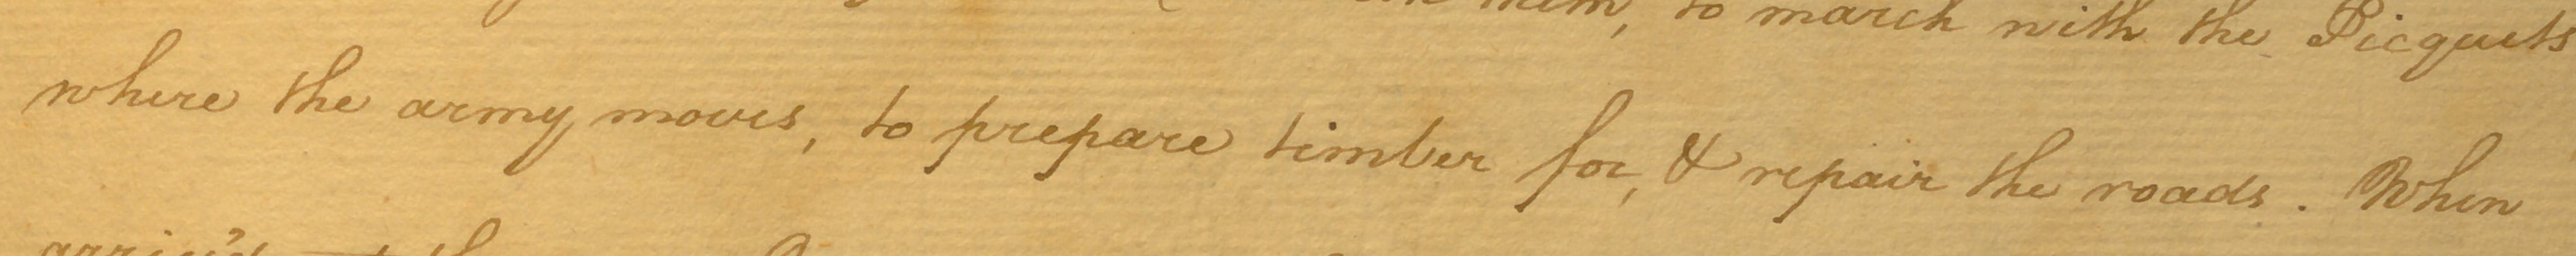where the army moves, to prepare timber for, & repair the roads. When
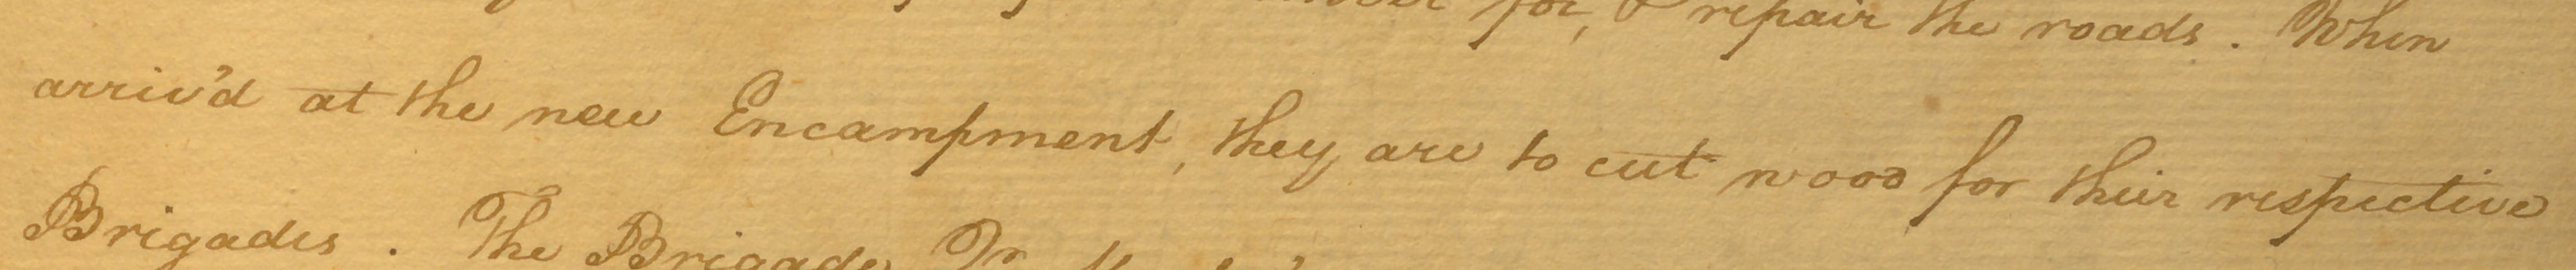arriv'd at the new Encampment, they are to cut wood for their respective
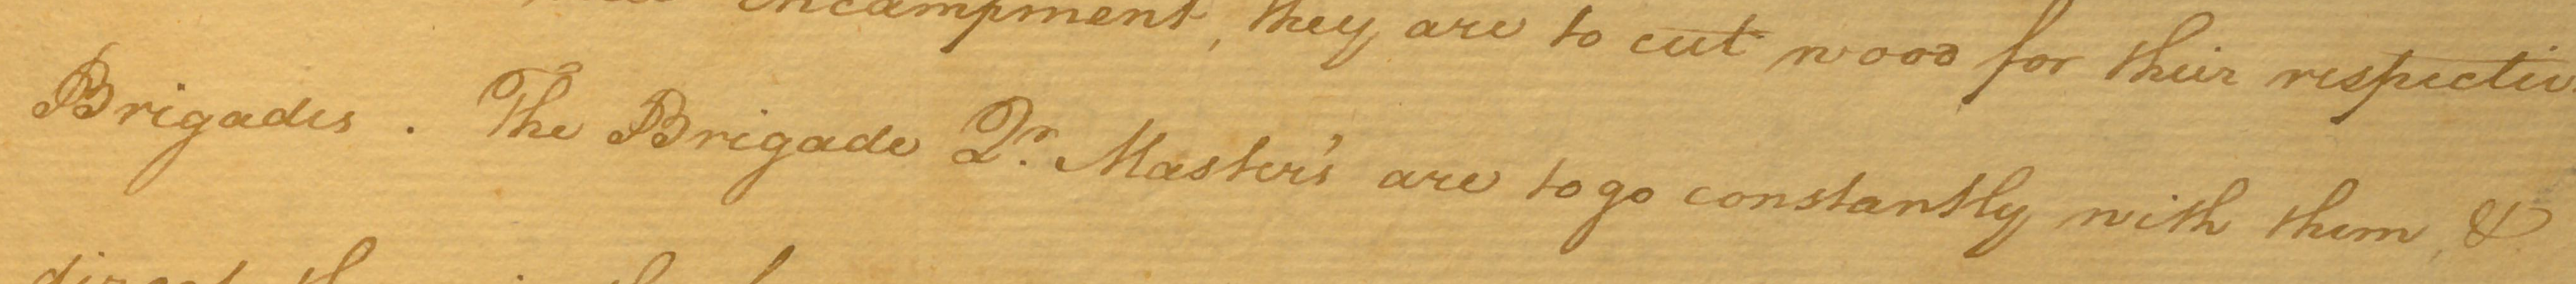Brigades. The Brigade Q^r. Master's are to go constantly with them &
